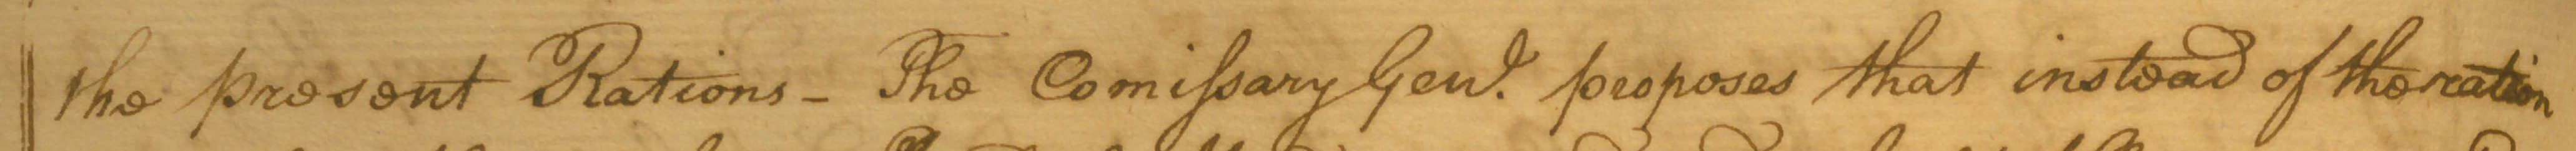the present Rations- The Comissary Gen^l. proposes that instead of the ration
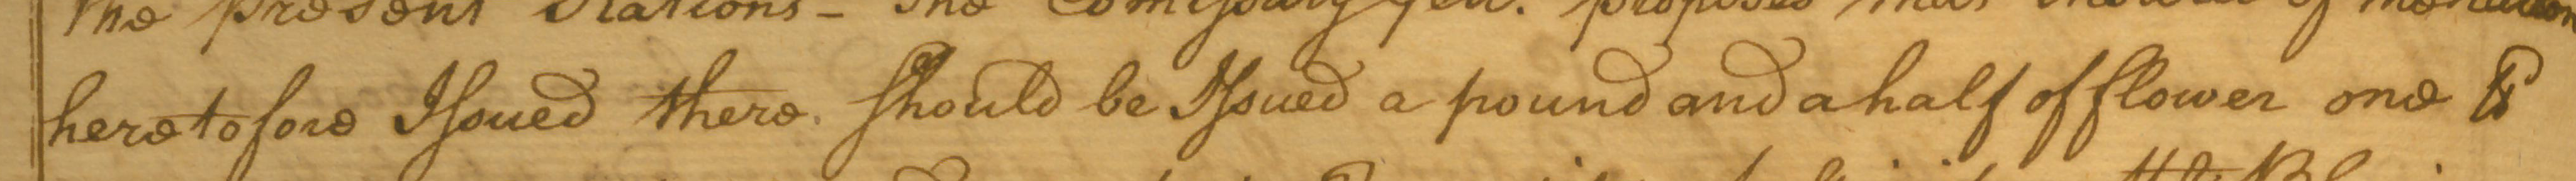heretofore Issued there should be Issued a pound and a half of flower one lb
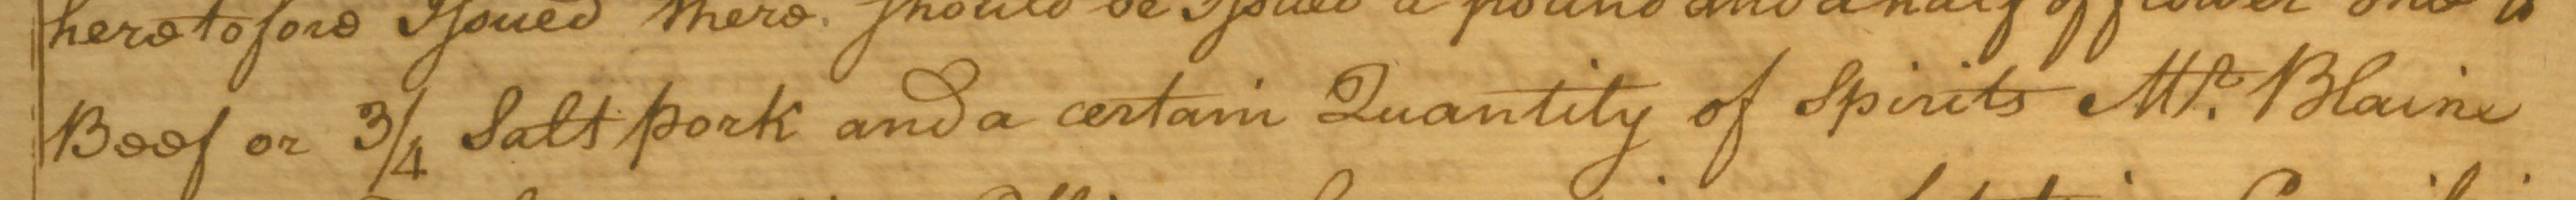Beef or 3/4 Salt pork and a certain Quantity of Spirits M^r. Blaine
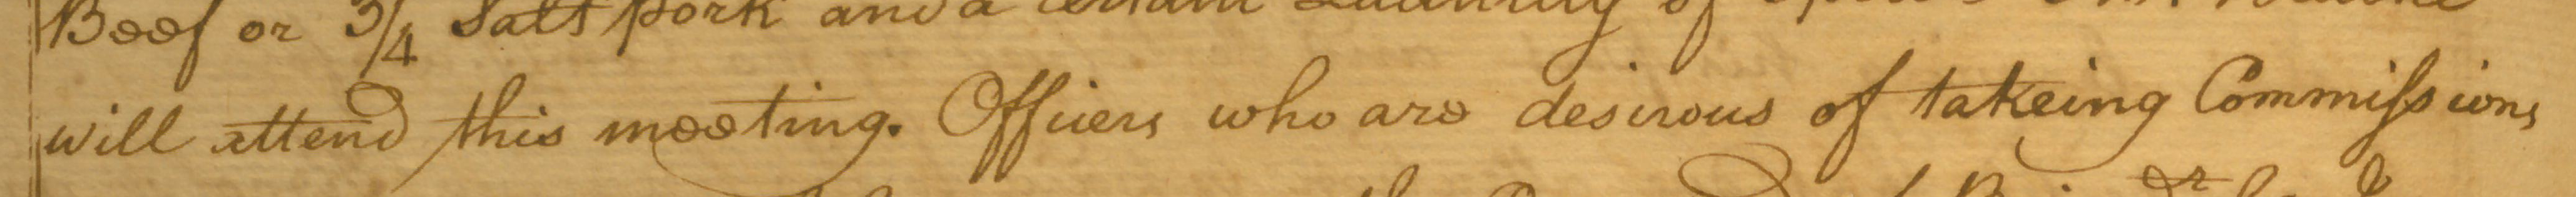will attend this meeting. Officers who are desirous of takeing Commissions
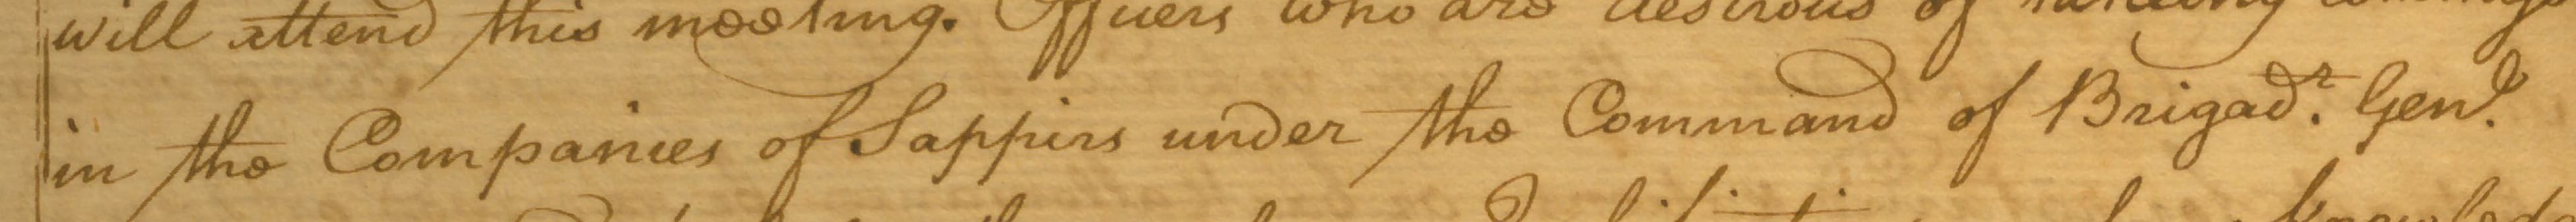in the Companies of Sappirs under the Command of Brigad^r. Gen^l.
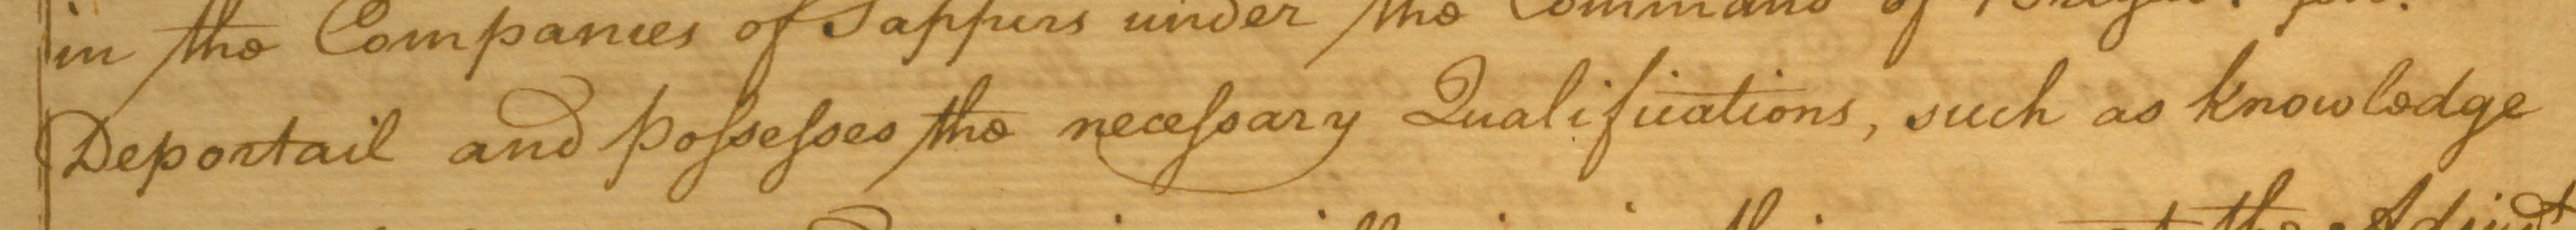Deportail and possesses the necessary Qualifications, such as knowledge
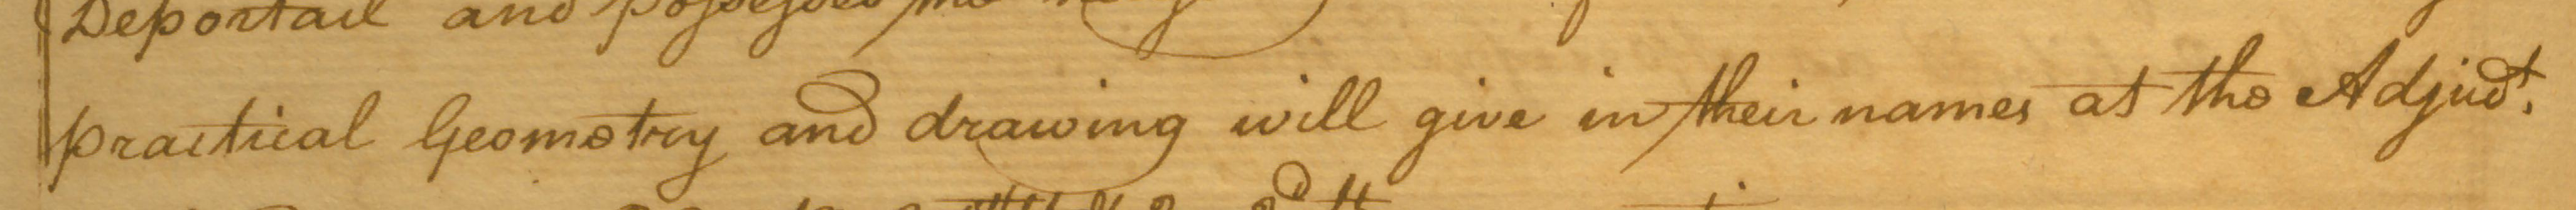practical Geometry and drawing will give in their names at the Adjud^t.
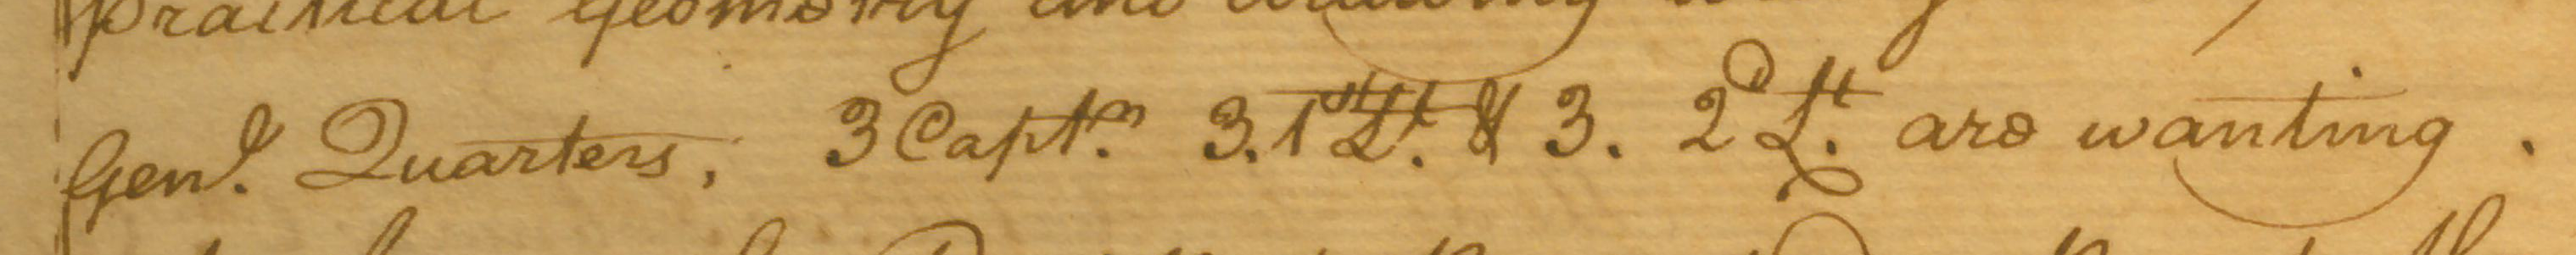Gen^l. Quarters. 3 Capt^n. 3. 1^st L^t. & 3. 2^d L^t. are wanting.
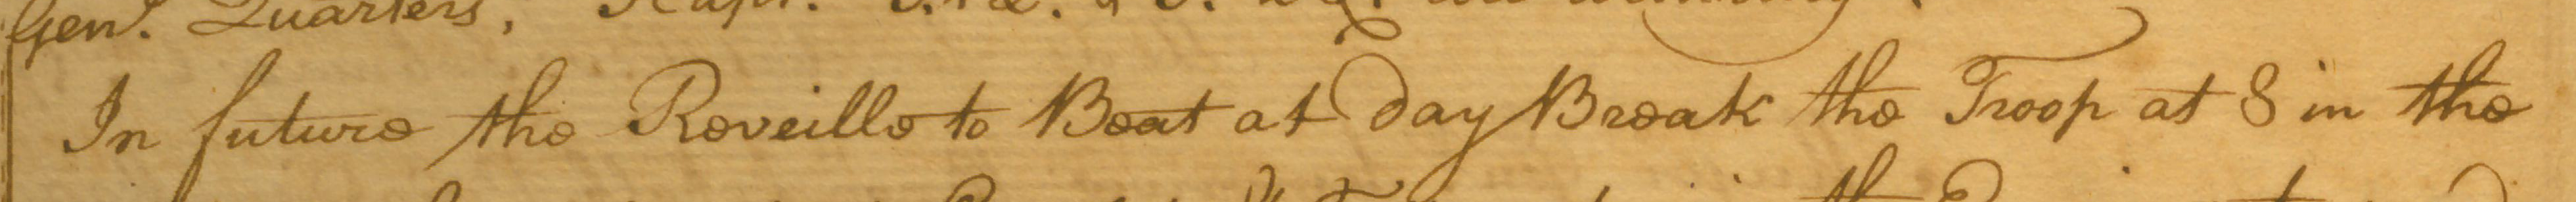In future the Reveille to Beat at day Break the Troop at 8 in the
